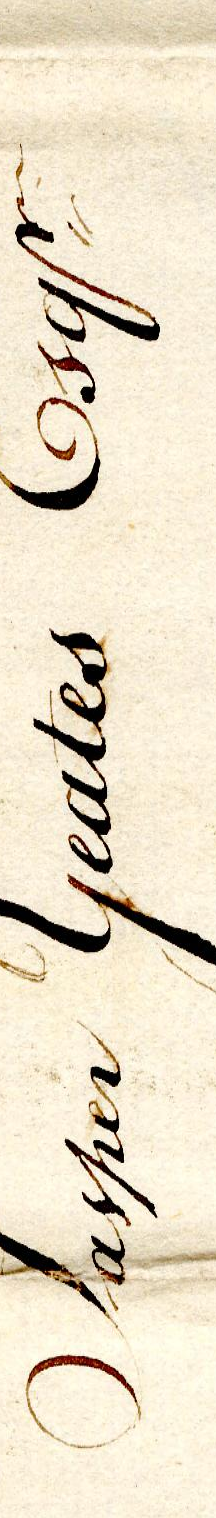Jasper Yeates Esq^r
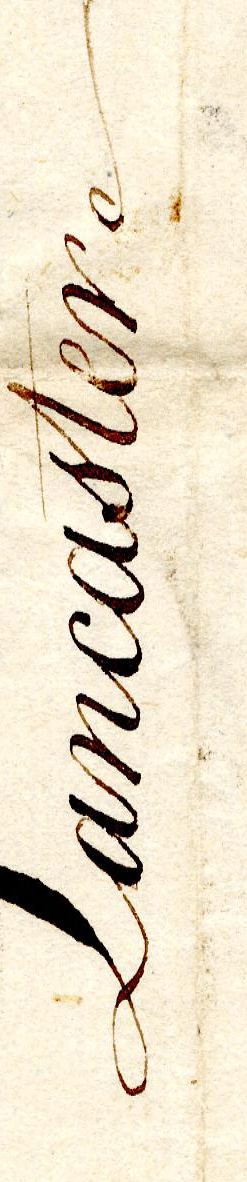Lancaster
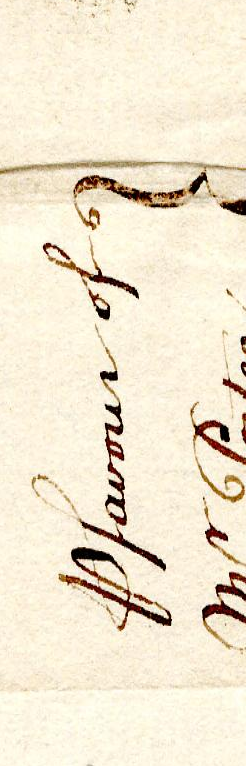per favour of
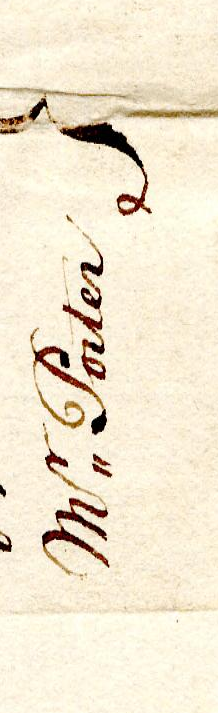M^r. Porter
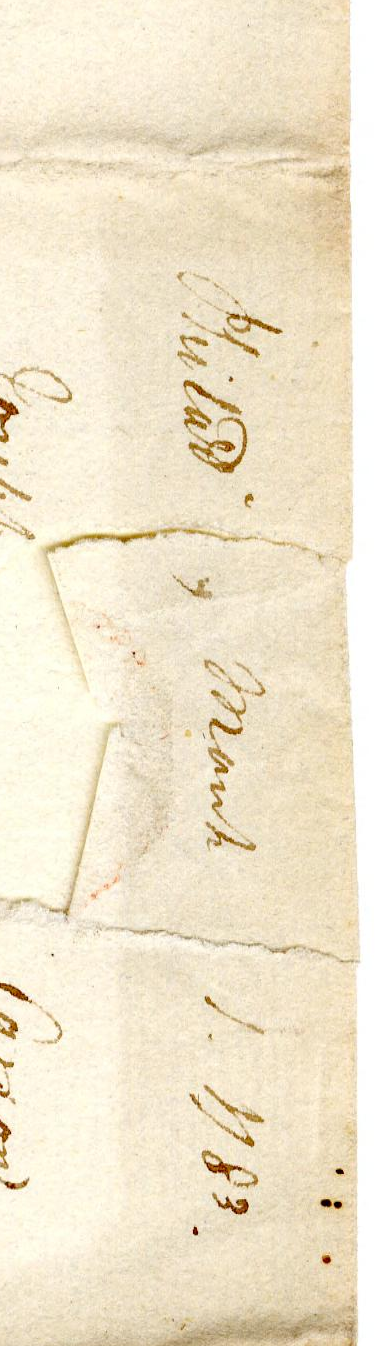Philad^a March 1. 1783
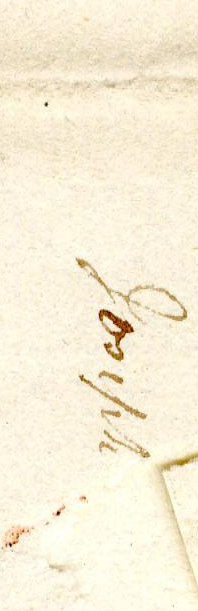Joseph
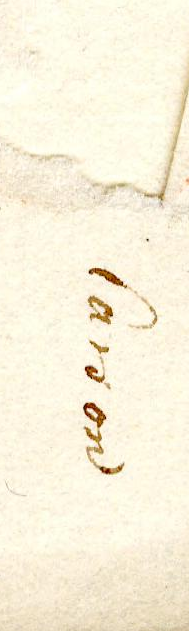Carson
